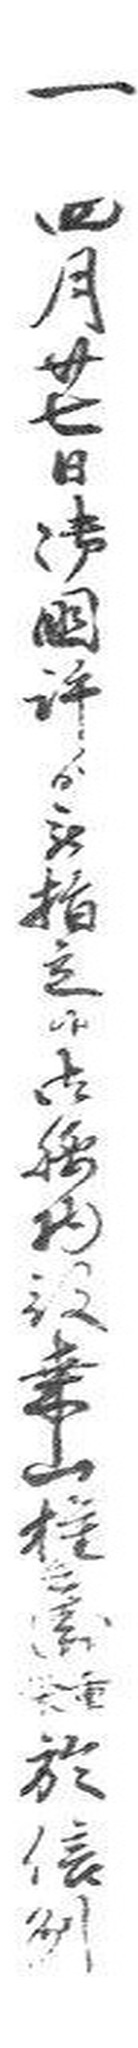一四月廿七日御国許ゟ被指立候御腰物役桑山権兵衛重栄於信
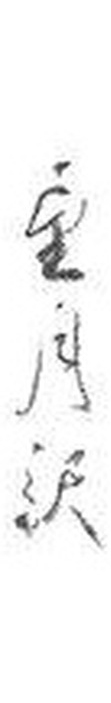望月駅
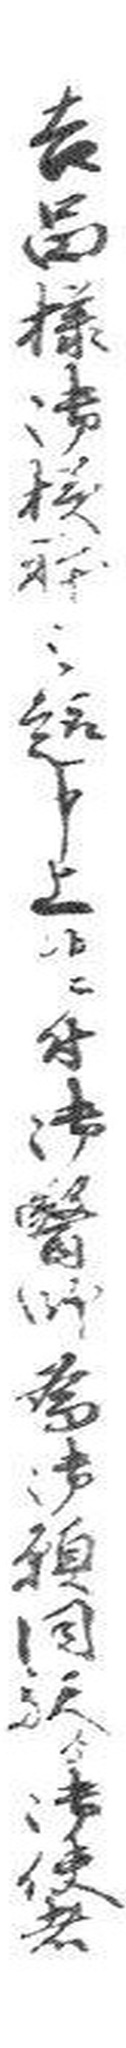吉品様御様体之趣申上候ニ付御医師為御願同駅ゟ御使者
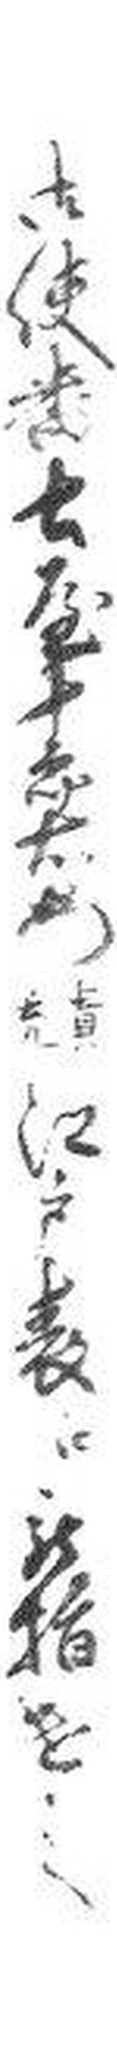御使番土屋十郎右衛門貴充江戸表江被指遣之
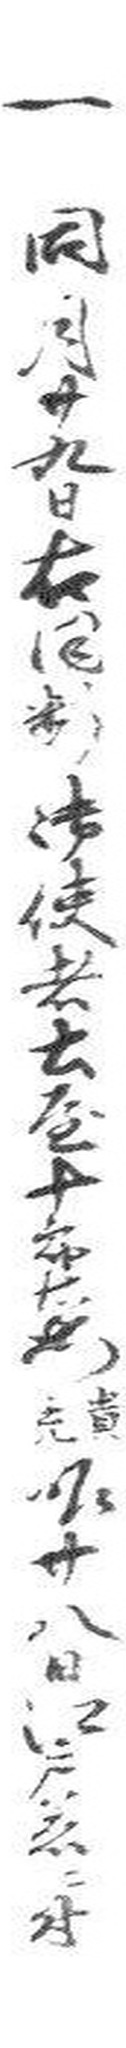一同月廿九日右同断御使者土屋十郎右衛門貴充昨廿八日江戸
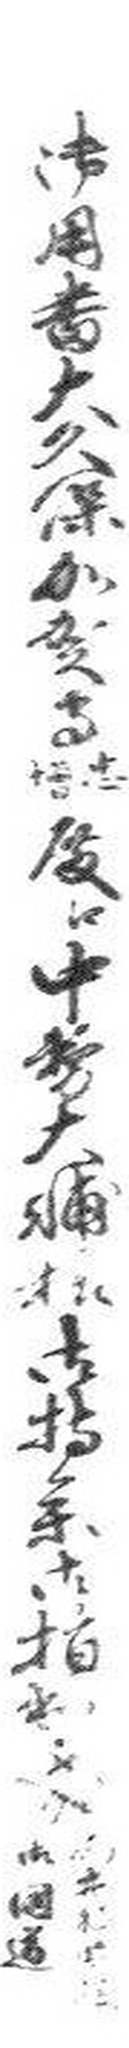御用番大久保加賀守忠増殿江中務大輔様御持参御指出被成
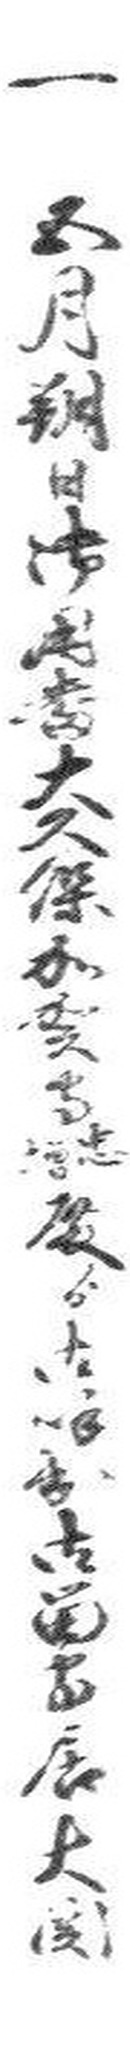一五月朔日御用番大久保加賀守忠増殿ゟ御呼出御留守居大関
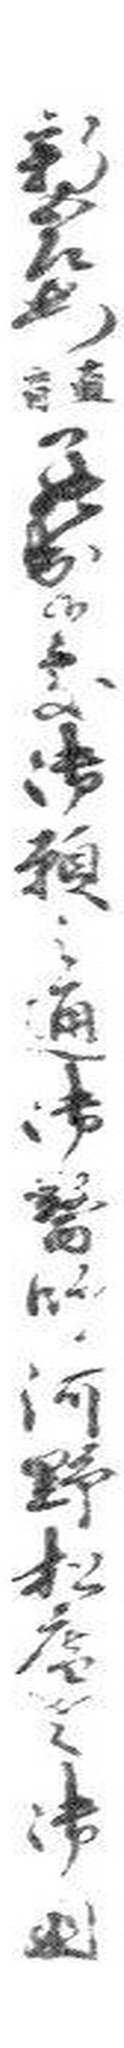新五左衛門直看罷出候処御願之通御医師河野松庵老御国
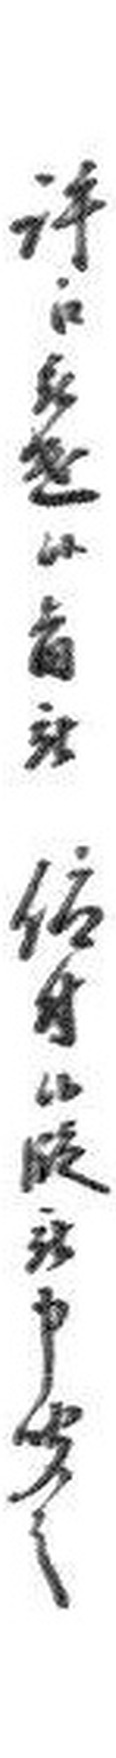許江被遣候旨被仰付候段被申聞之
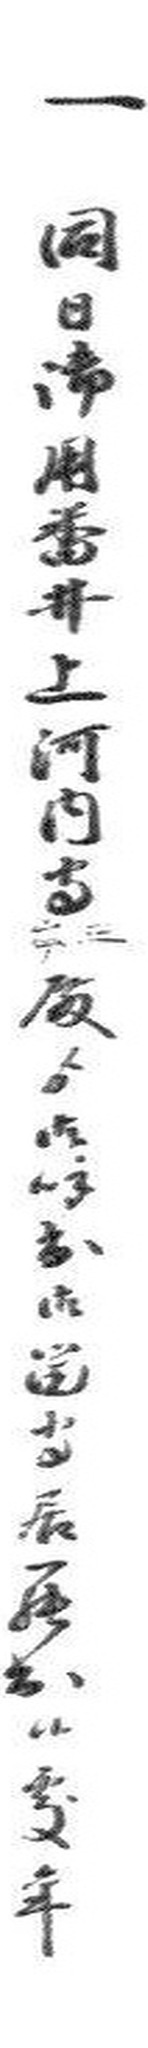一同日御用番井上河内守正岑殿ゟ御呼出御留守居罷出候処年
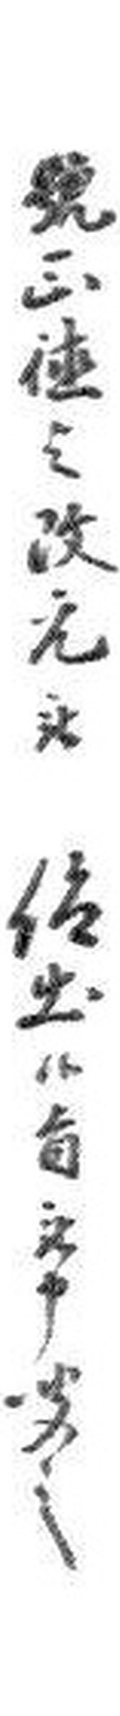号正徳与改元被仰出候旨被申聞之
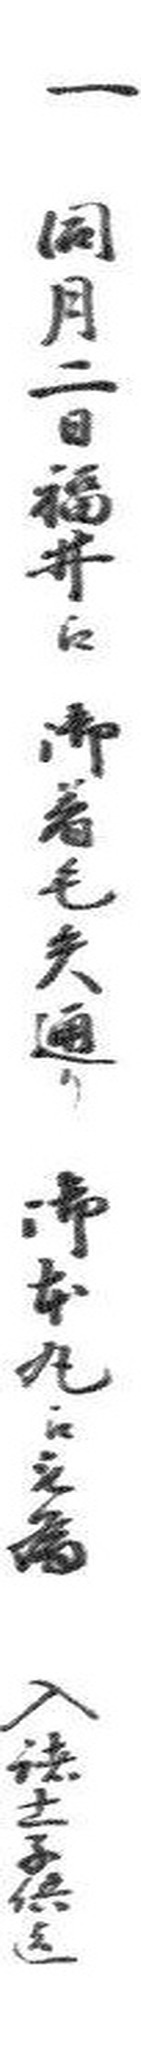一同月二日福井江御着毛矢通り御本丸江被為入諸士子供迄
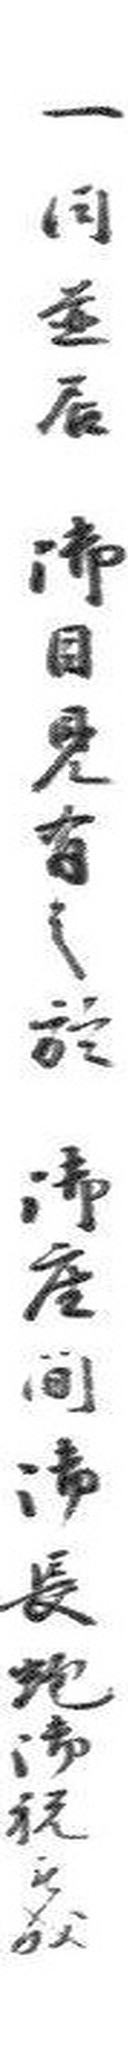一同並居御目見有之於御座間御長蚫御祝被成
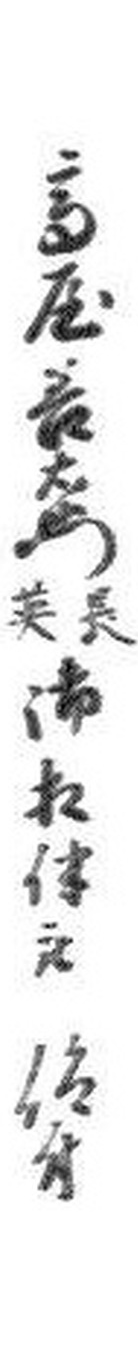高屋善右衛門長英御相伴被仰付

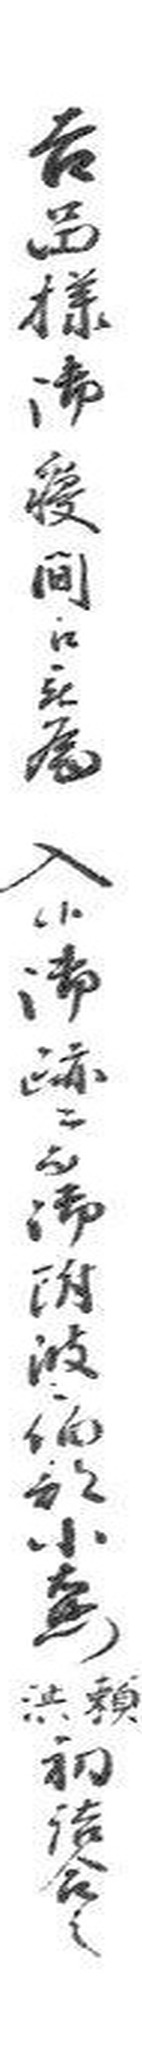吉品様御寝間江被為入候御跡ニ而御附波々伯部小右衛門頼洪初
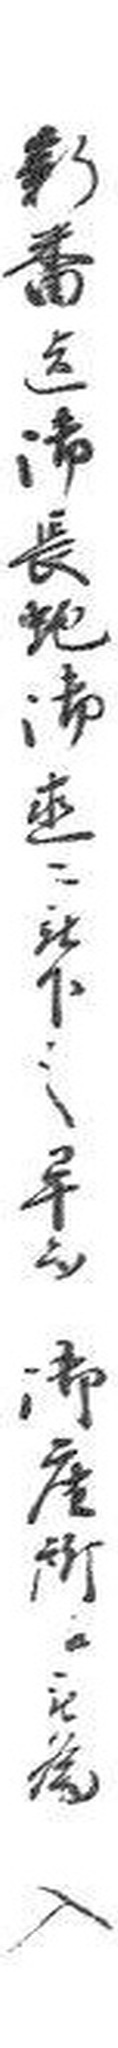新番迄御長蚫御直ニ被下之畢而御座所江被為入
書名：家譜 二十八 吉邦公 従宝永七年七月五日到正徳元年十二月
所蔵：福井県文書館 Fukui Prefectural Archives
